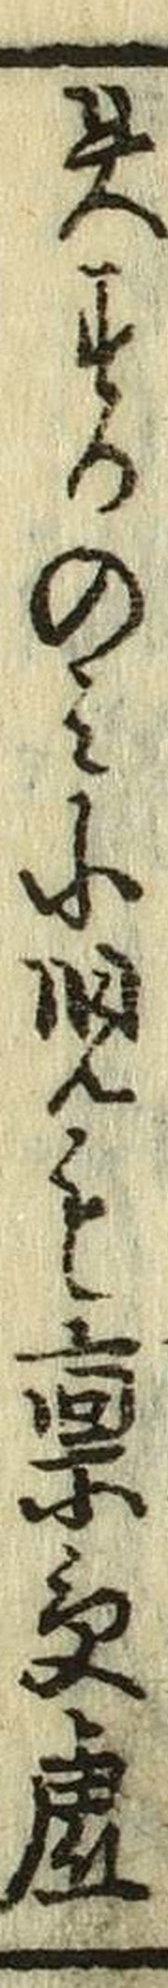失するのみ小児も稟受虚
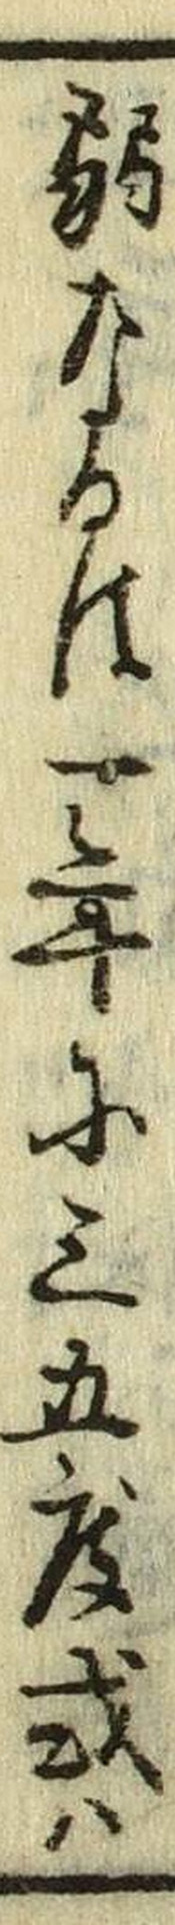弱なるは一年に三五度或は
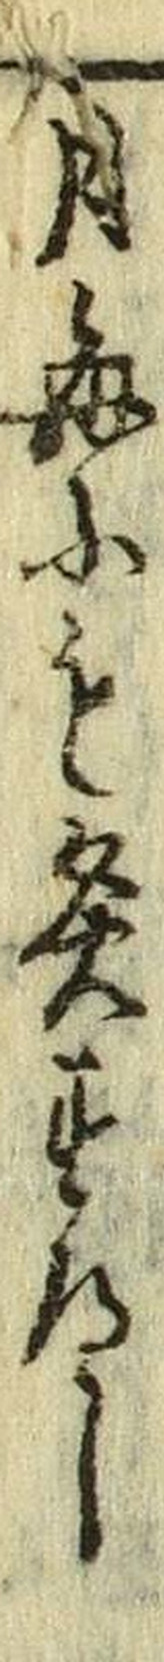月毎にも灸すへし
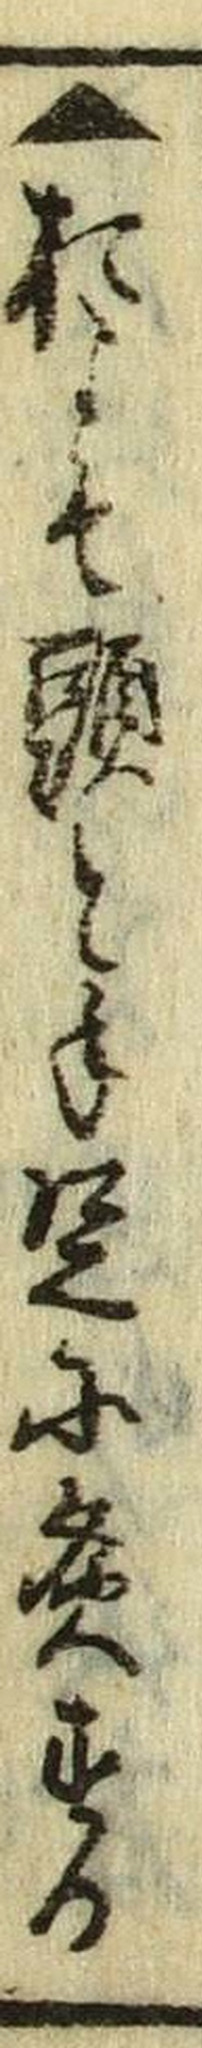▲およそ頭と手足に灸する

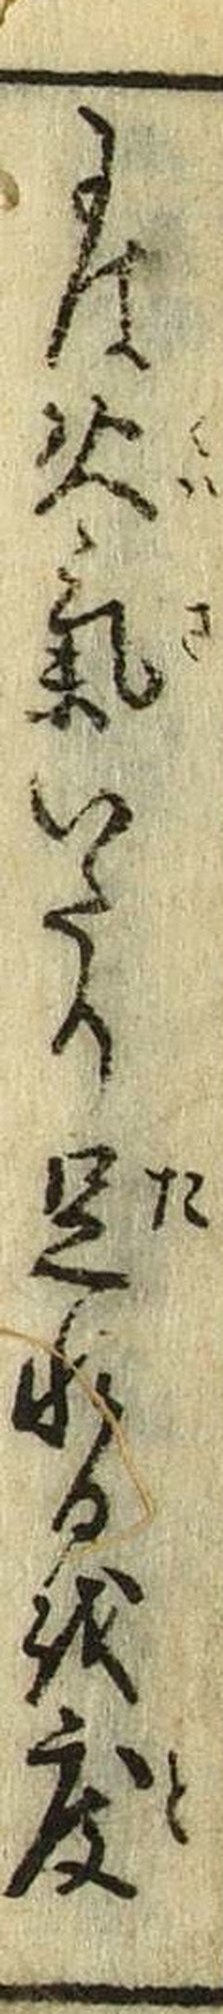には火気いたり足れるを度
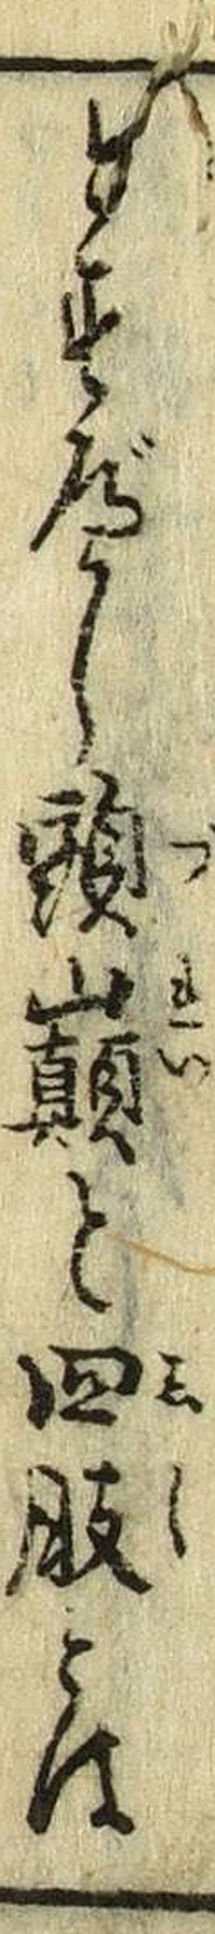とすべし頭巓と四肢とは
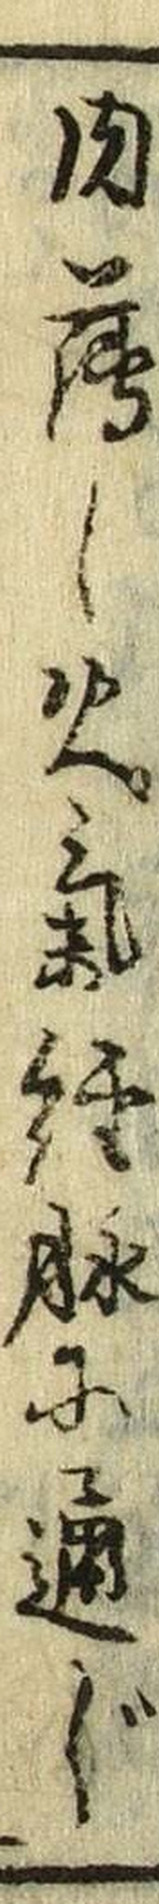肉薄し火気経脈に通じ
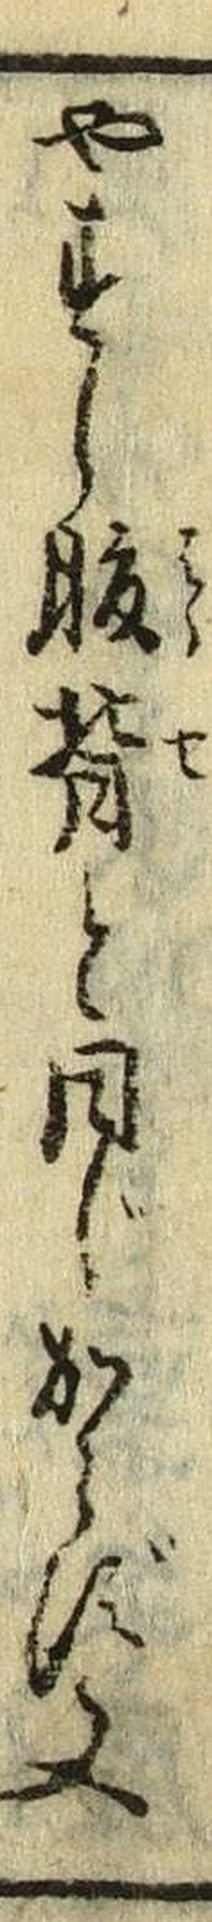やすし腹背と同じからず又
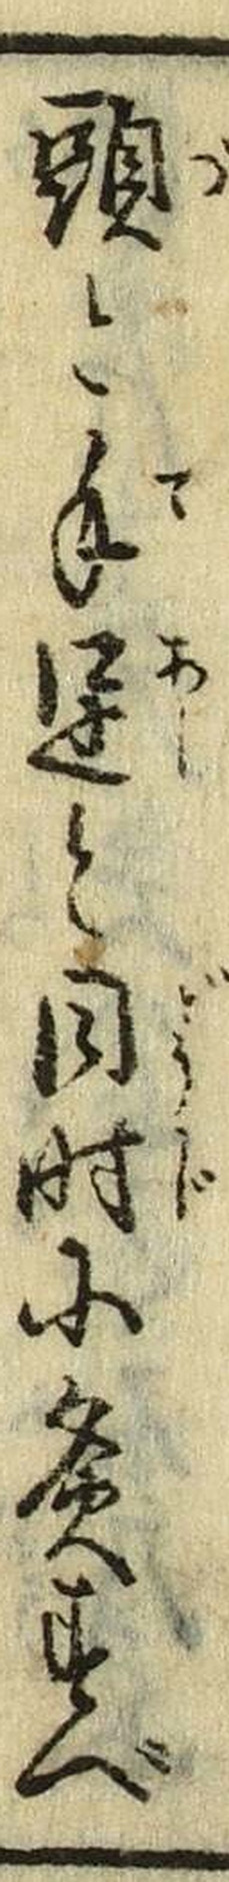頭と手足と同時に灸すべ
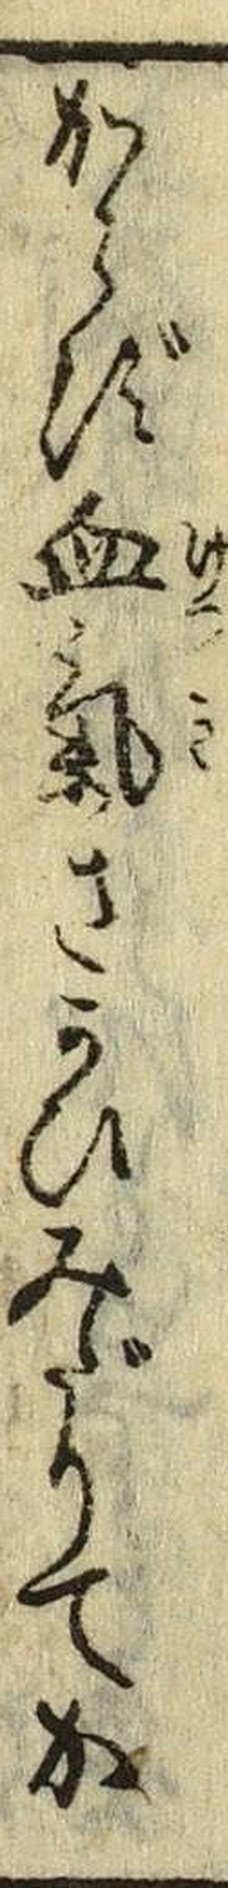からず血気さかひみだりてか
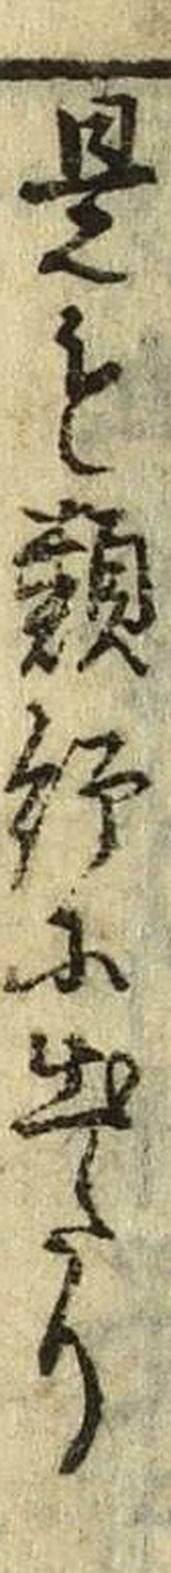是も類経に出たり
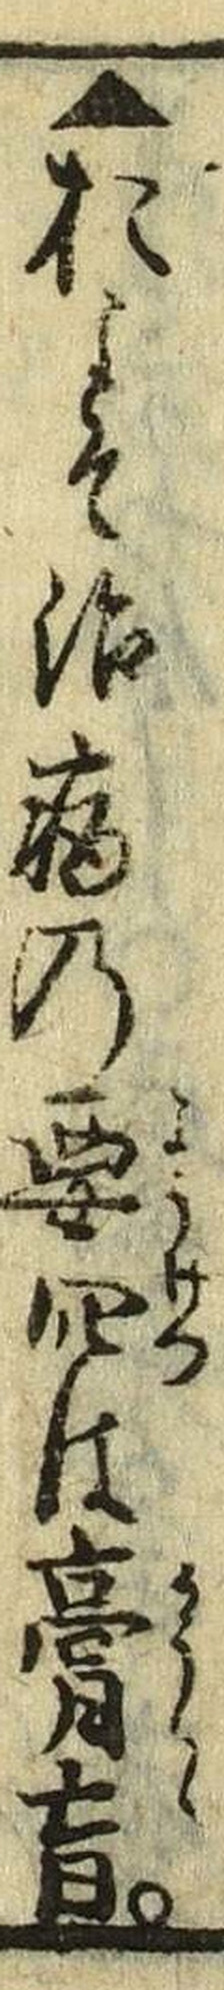▲およそ治病の要穴は膏肓。
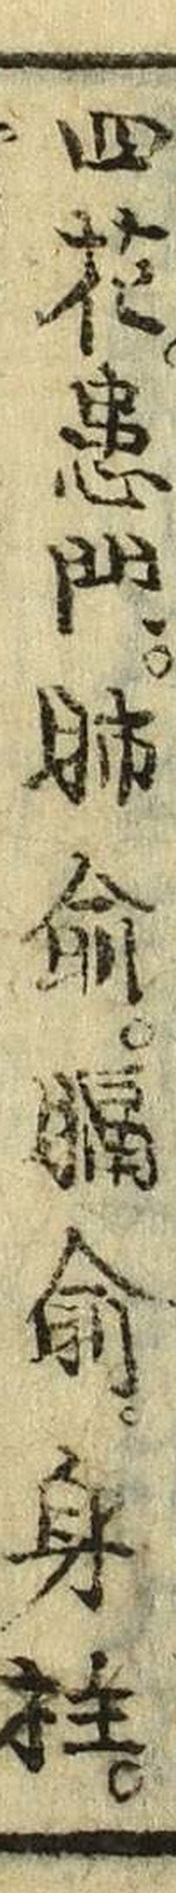四花。患門。肺兪。膈兪。身柱。
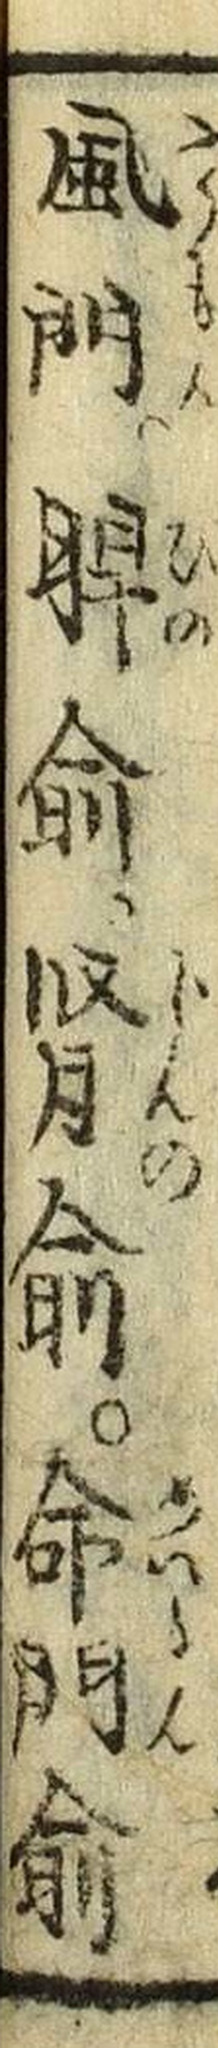風門。脾兪。腎兪。命門兪
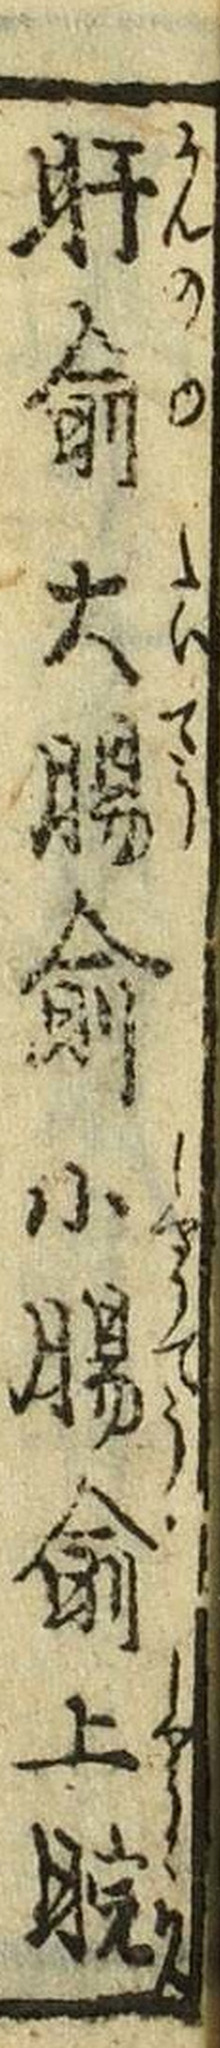肝兪大腸兪小腸兪上脘
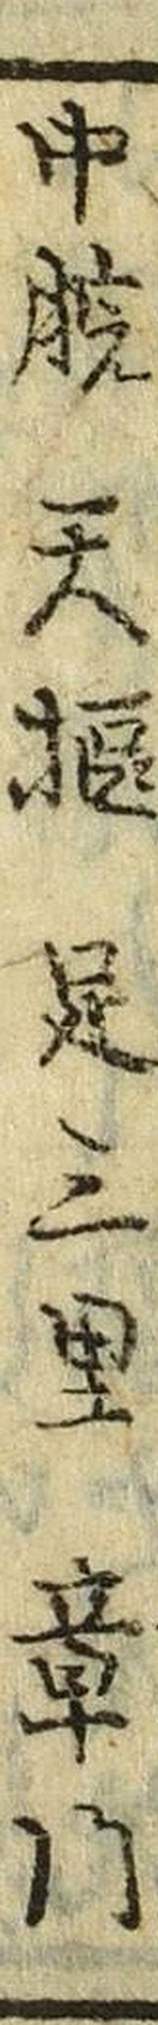中脘天枢足三里章門
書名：居家養生記
